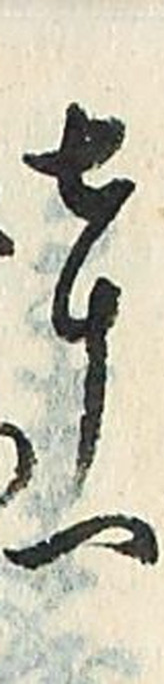七十一
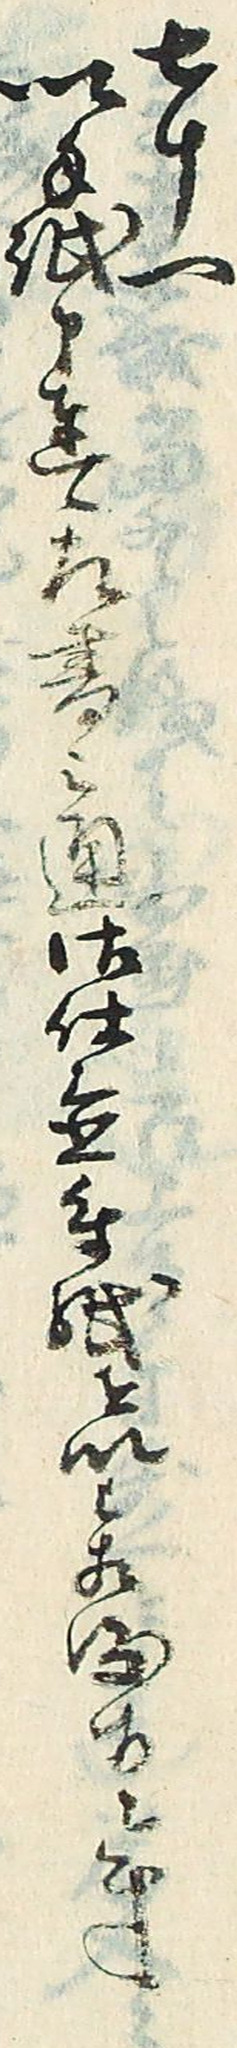以手紙申達候左書之通御仕置付紙を以被相渡候ニ付
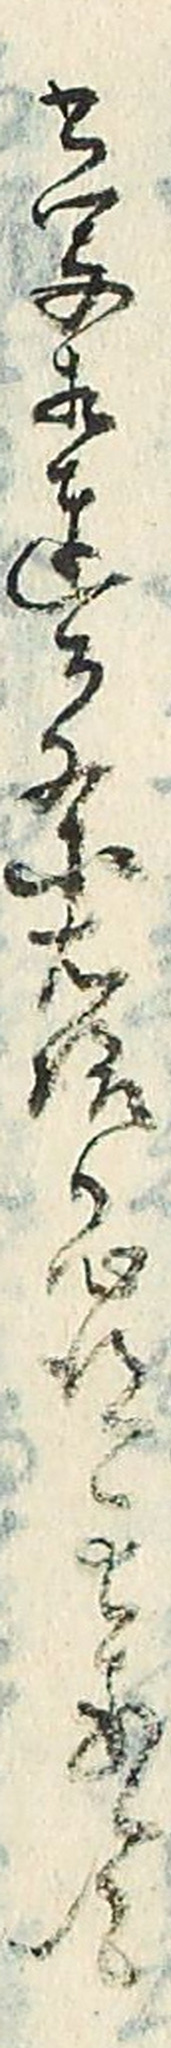書写相達候条右様御心得可被成候以上
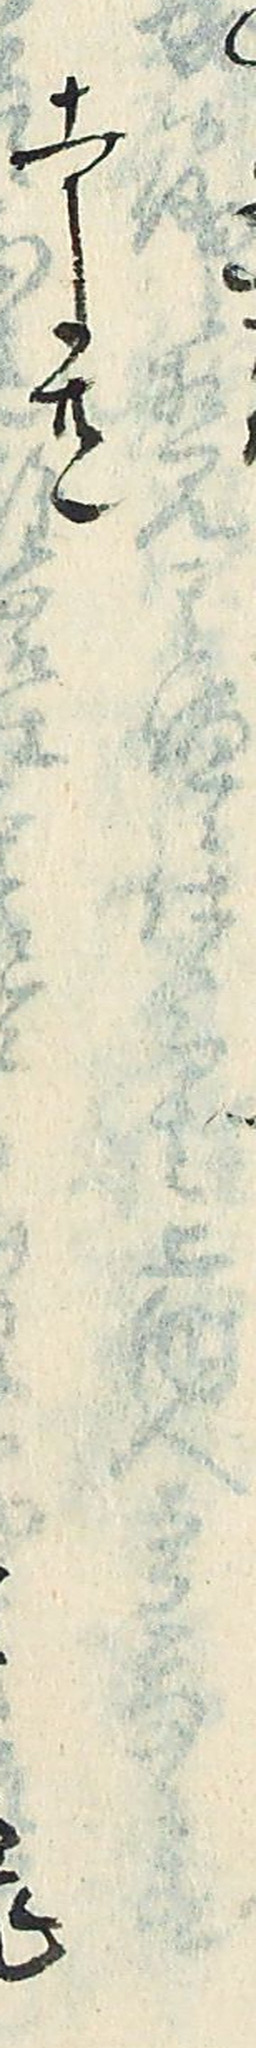十一月廿日
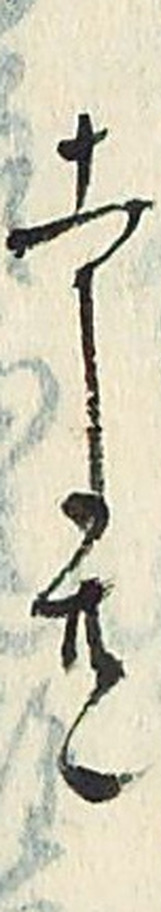十一月廿日
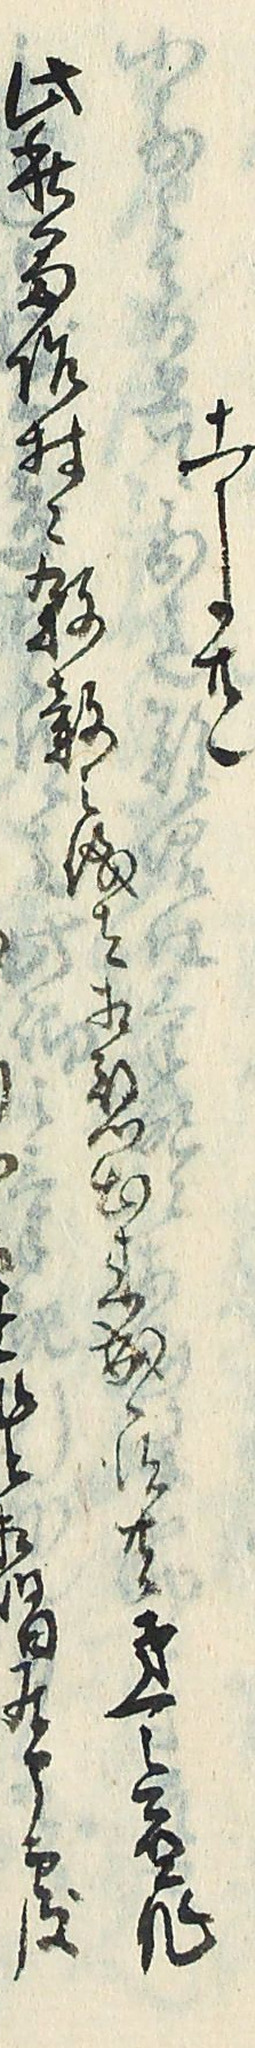此秋畠作村々雑穀之儀者相應出来成候得共第一之藍作
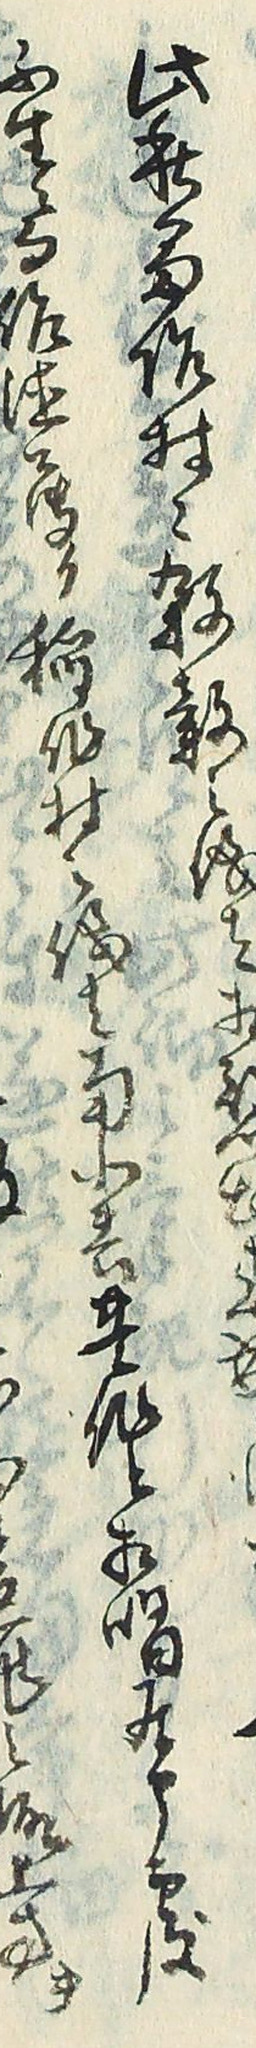不生ニ而作徳薄ク稲作村之儀者南北共豊作と相唱居申處
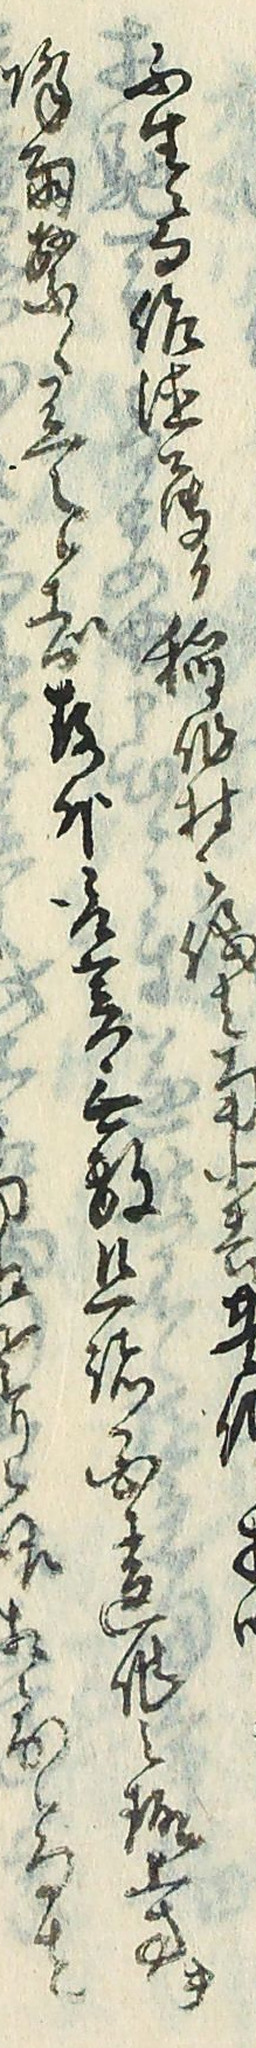降雨繁く有之候哉存外取実無数且諸国違作之趣上方ヲ
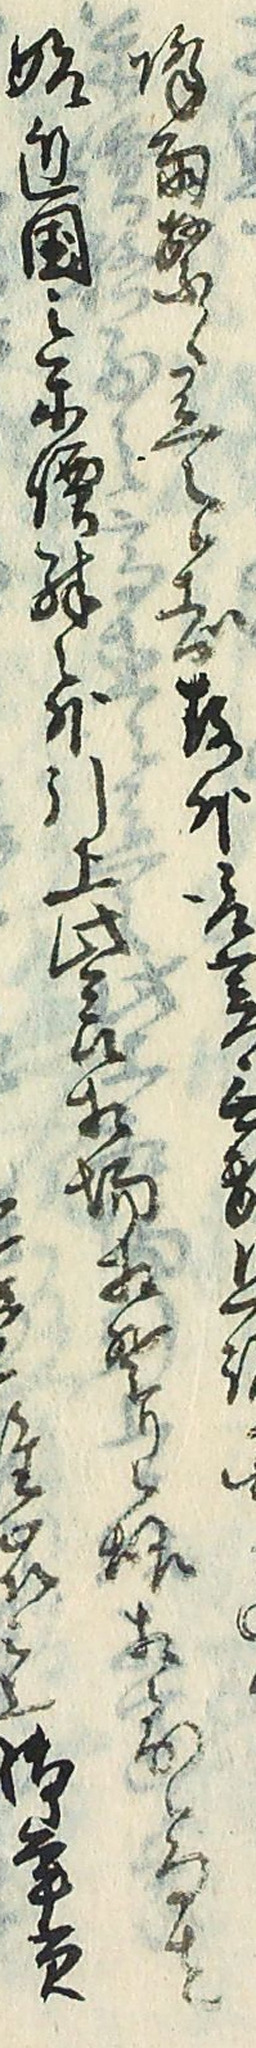始近国之米價殊之外引上此節相場登り候様相成候而者
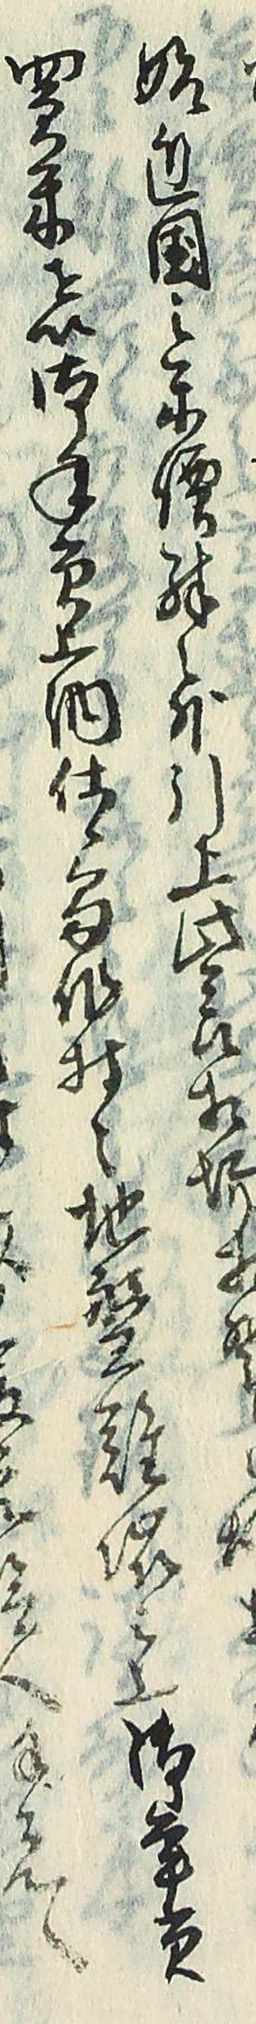買米を以御年貢上納仕候畠作村々地盤難渋之上御年貢
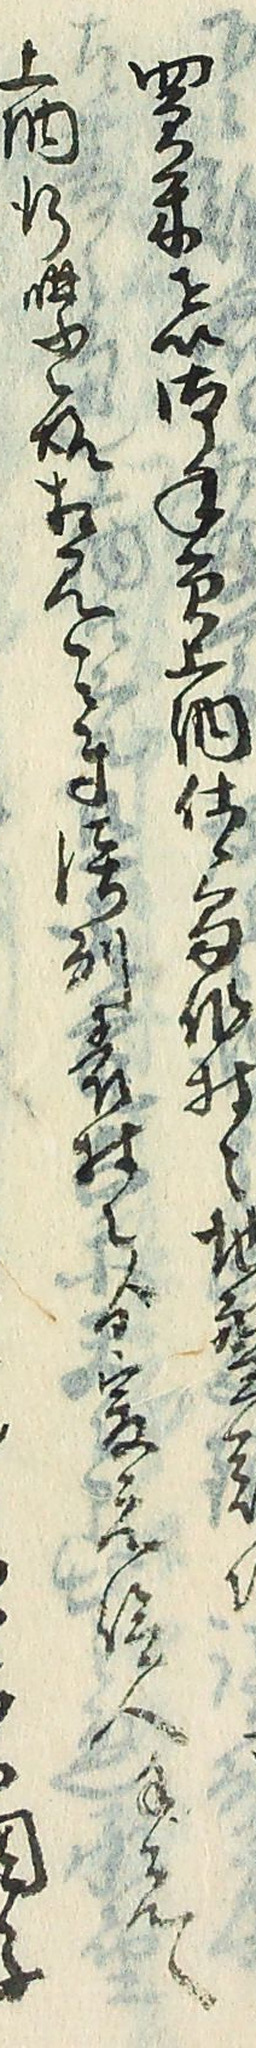上納行噤候様相見候ニ付淡州表村々ゟ爰元給人手元へ
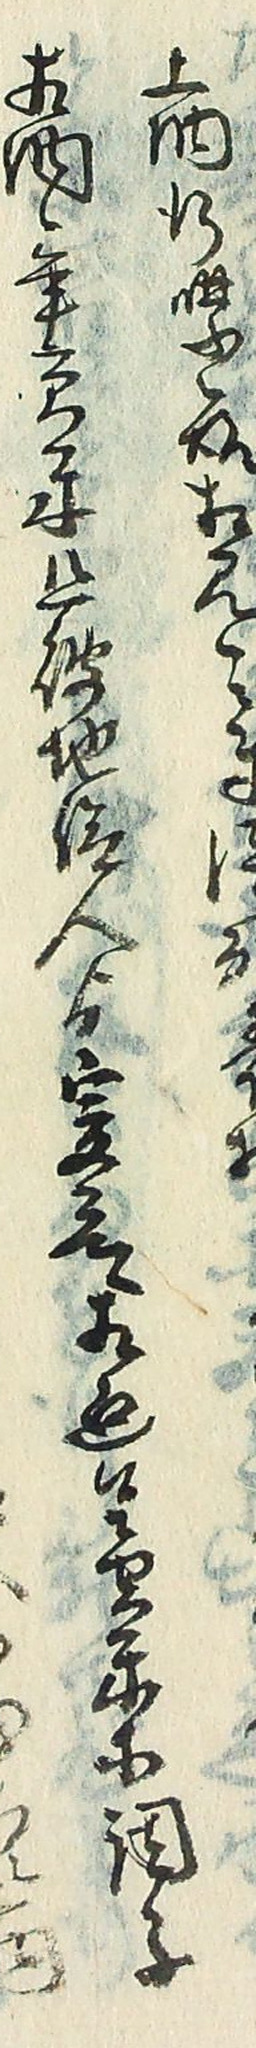相納候年貢米且彼地給人ゟ爰元へ相廻候賣米等調子
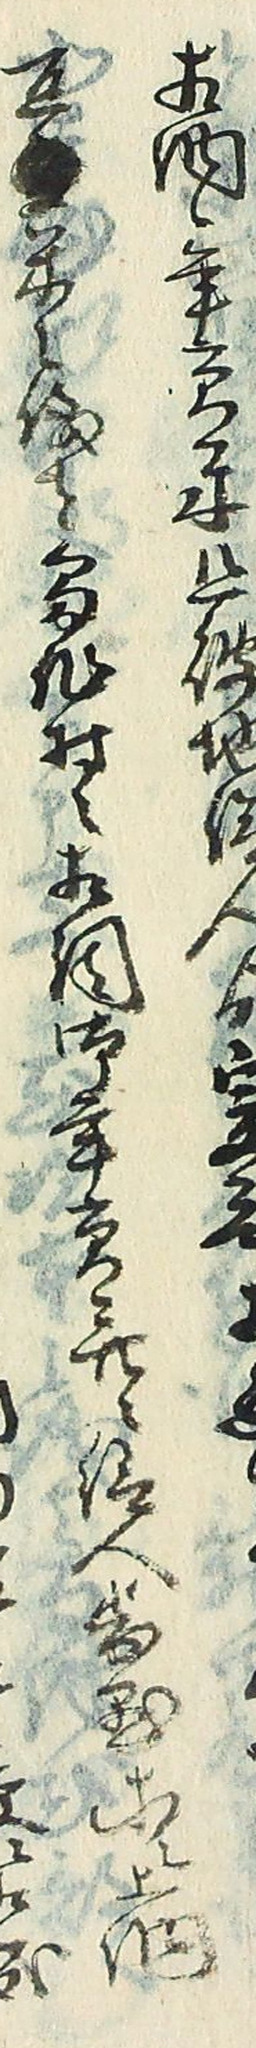宜米之儀者畠作村々相調御年貢幷ニ給人歩懸等之上納
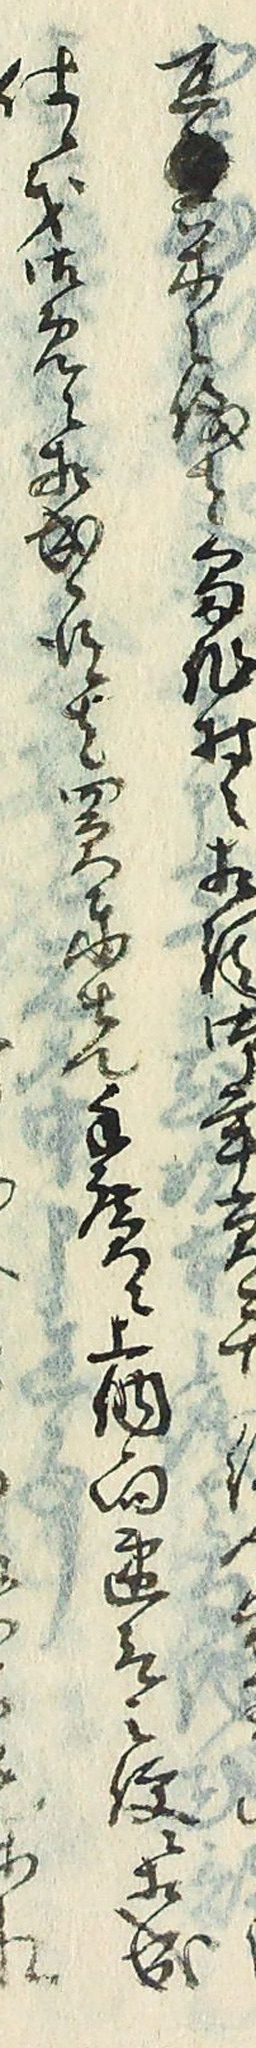仕候義御免ニ相成候得者買米先手廣ニ上納向速取之便ニ相成
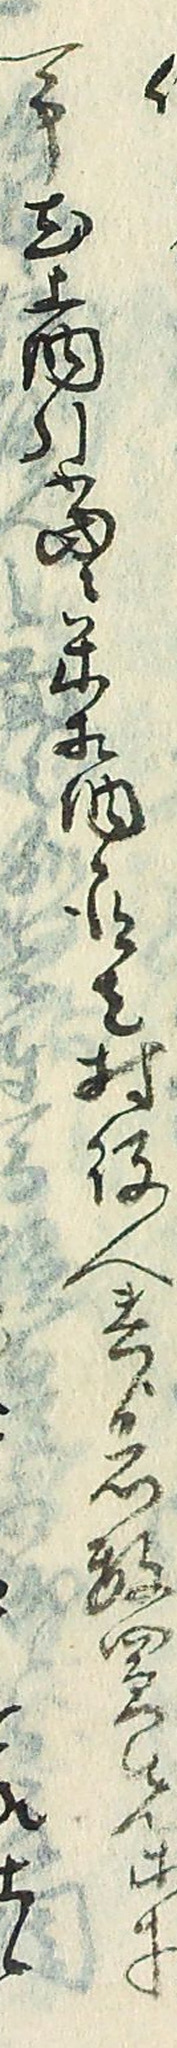可申尤上納引當ニ米相納候得者村役人共ゟ石数買先等相
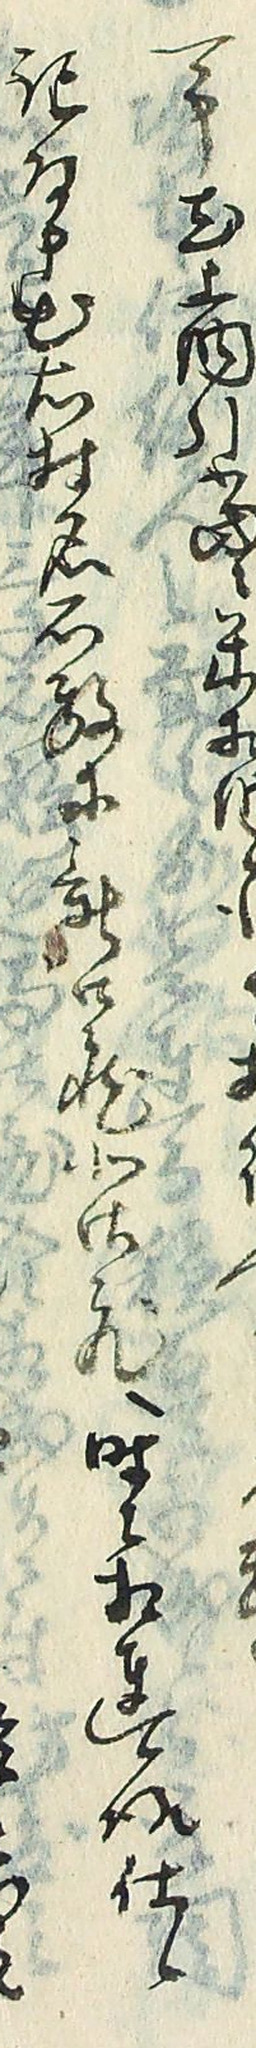記為申出右村名石数等新御蔵北御蔵へ時々相達候様仕候
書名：諸御趣意書并御下知向之写
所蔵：鳴門教育大学 Naruto University of Education
